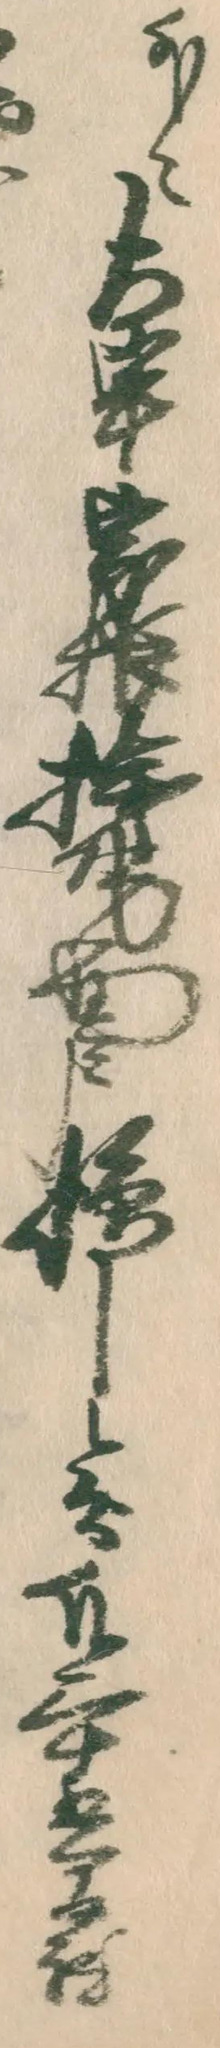外ニ右牢家根押瓦面も損し候間凡三十五間程
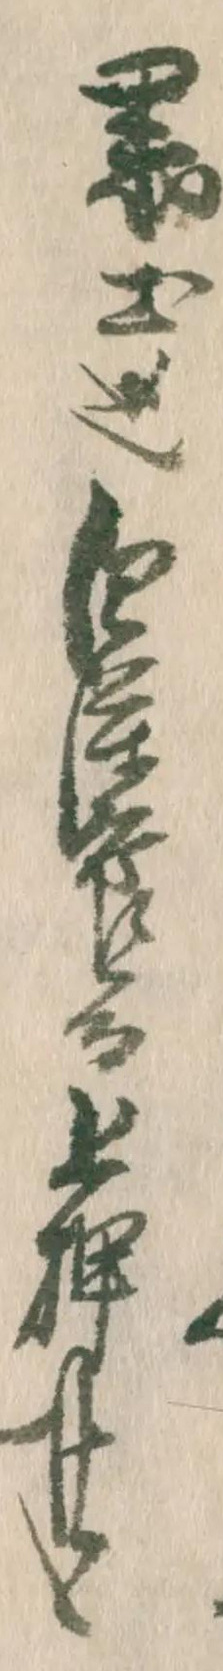藁土込白漆喰ニて上押仕候
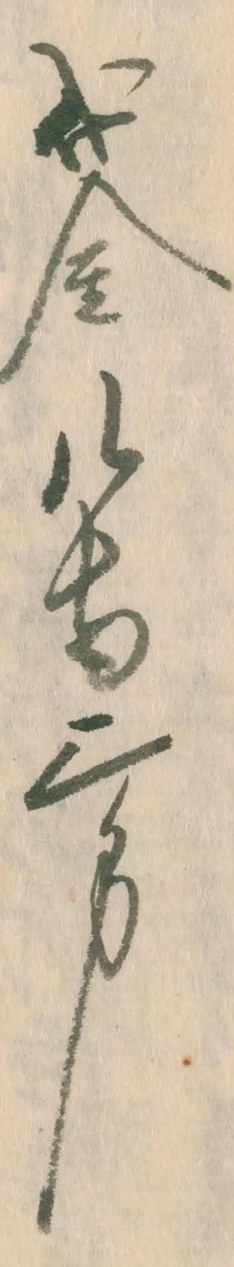此金八両三分
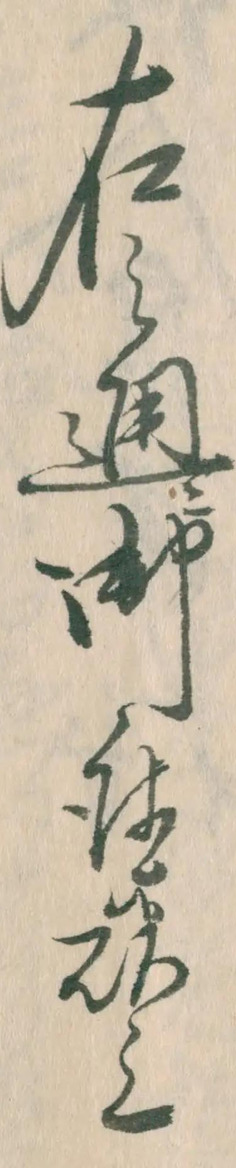右之通ニ御座候以上

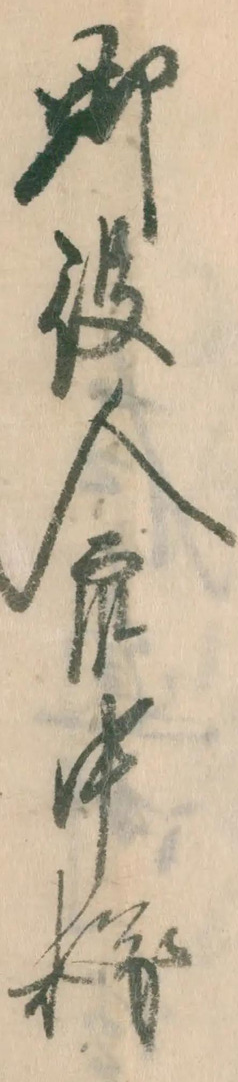役人衆中様
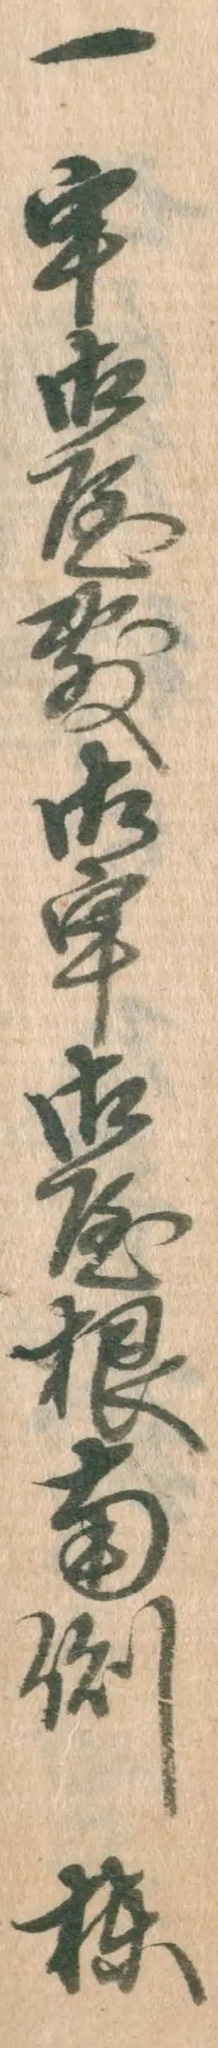一牢御屋敷御牢御家根南側之棟
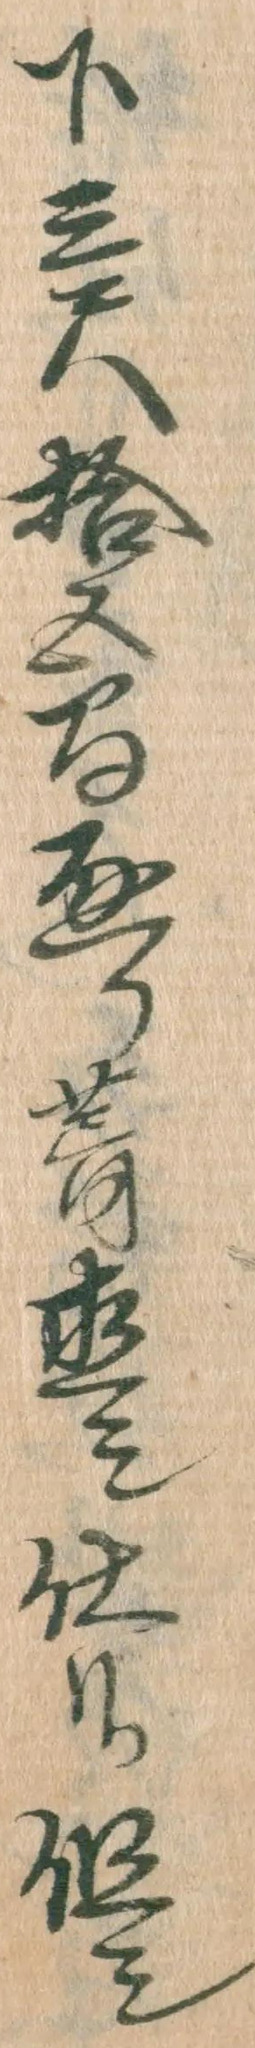下三尺拾五間通り葺直シ仕候但シ
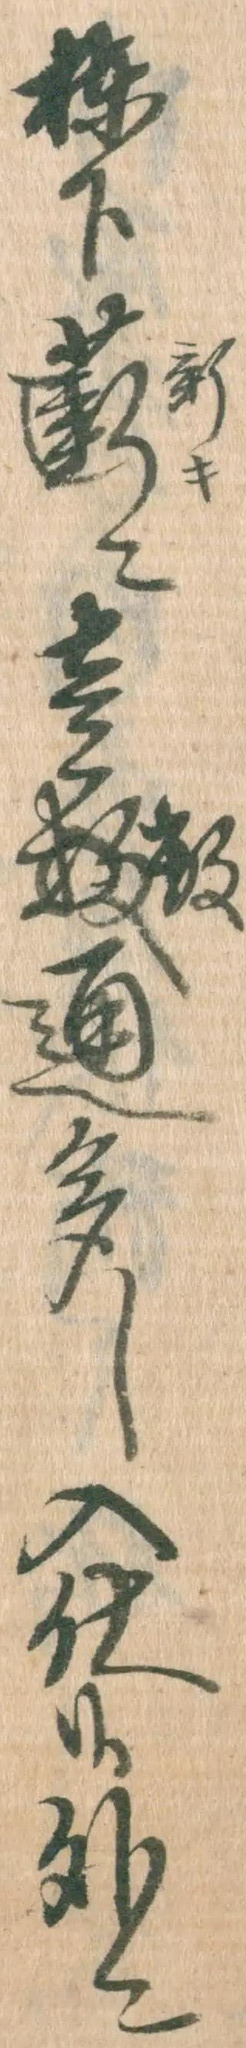軒下新キニ壱枚通たし入仕候外ニ
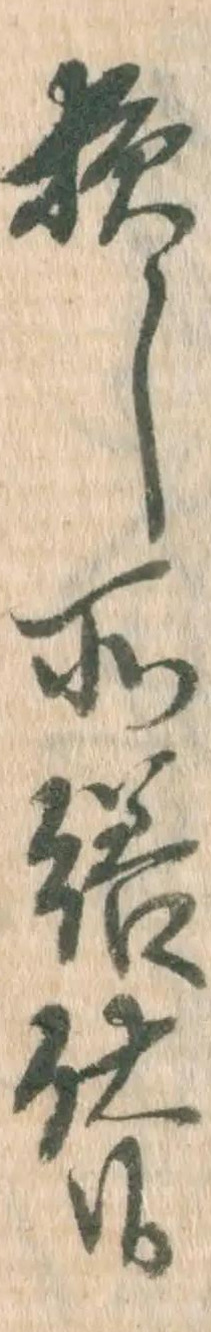損し候所繕仕候
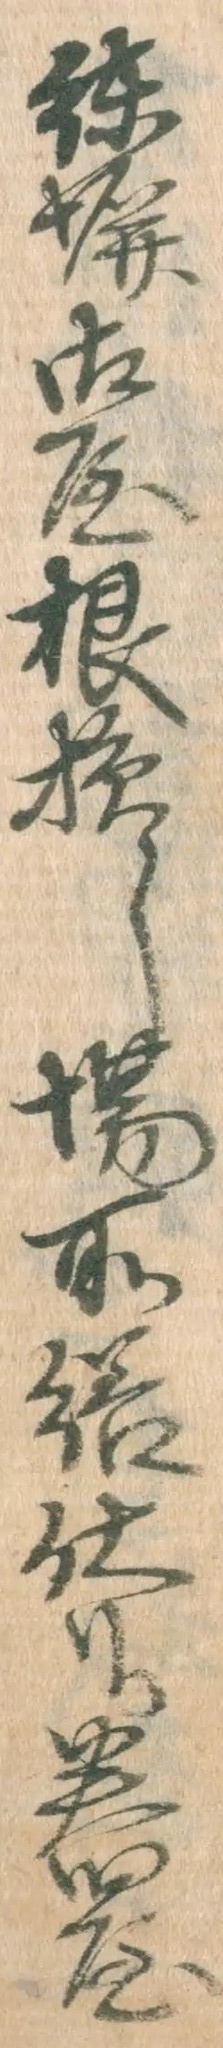煉塀御屋根損し候場所繕仕候舂屋

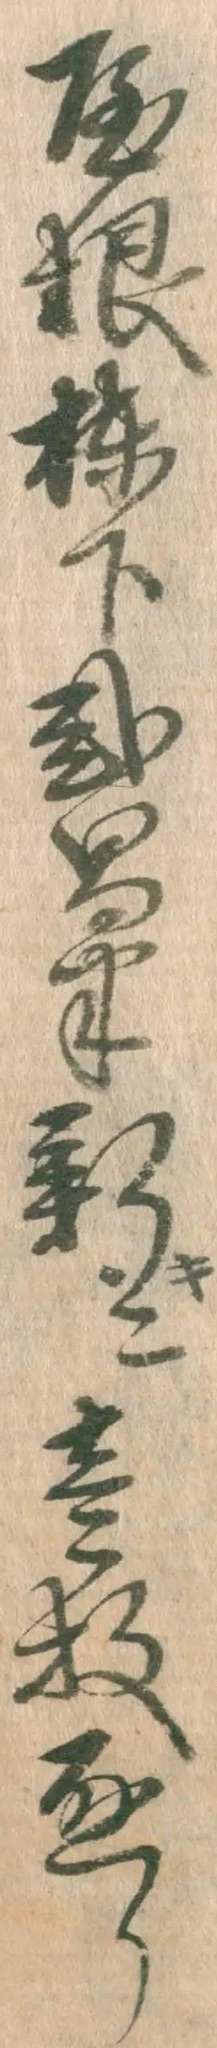屋根棟下弐間半新キニ壱枚通り
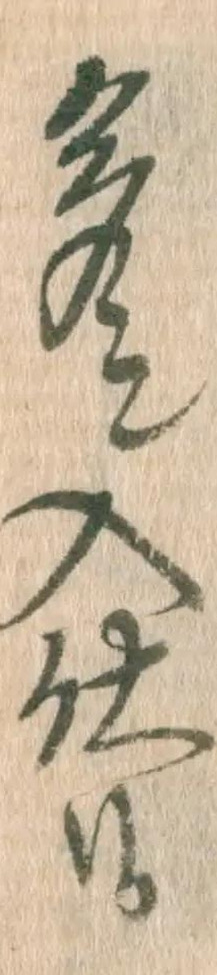たシ入仕候
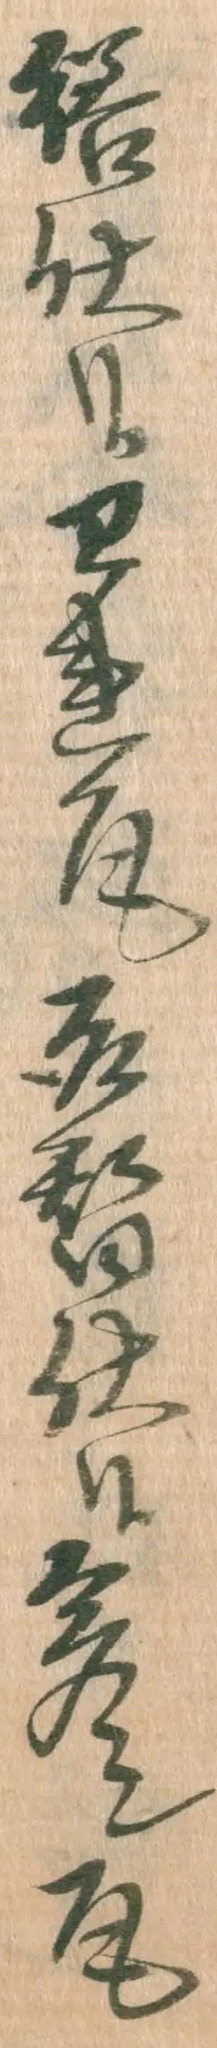繕仕候われ瓦取替仕候たシ瓦
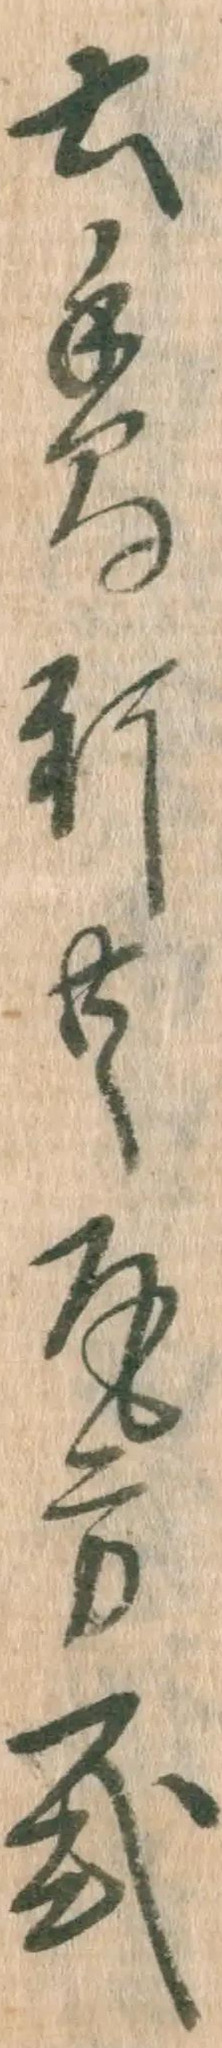土手間料共瓦方一式
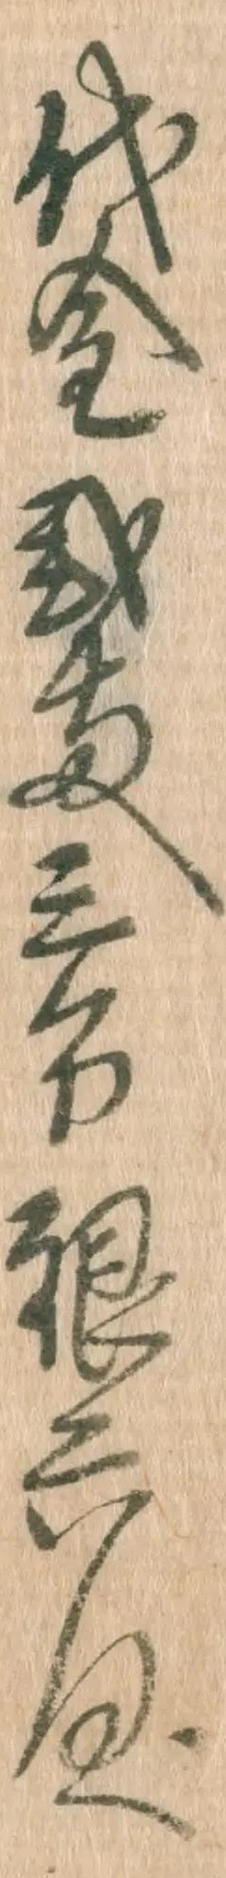代金弐両三分銀六匁
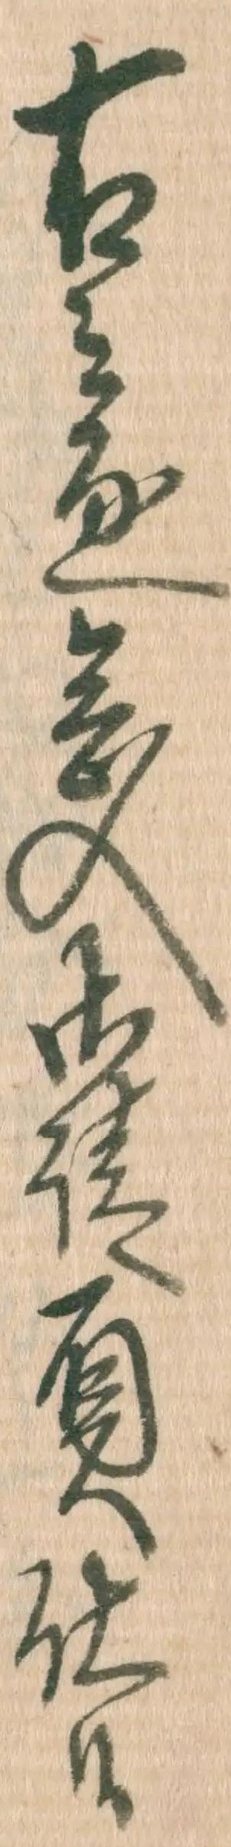右之通念入御請負仕候
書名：七十冊物類集 71巻. [44] 四十三 牢屋敷御普請御修覆地震ニ付骨折候牢屋掛御褒美之部
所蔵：国立国会図書館 National Diet Library, JAPAN
